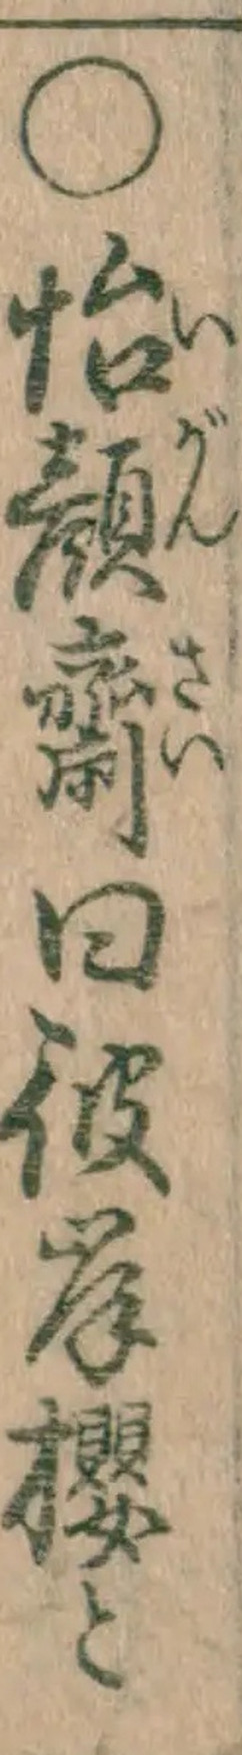○怡顔斎曰彼岸桜と
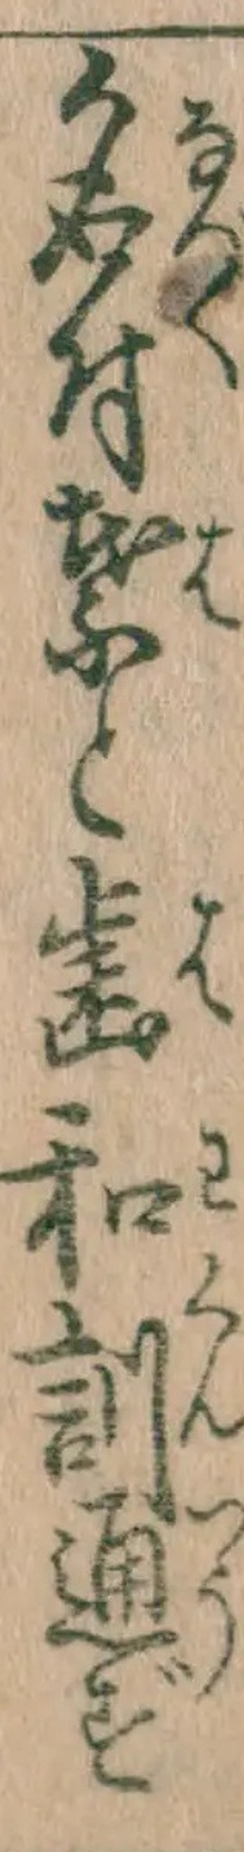名付葉と歯和訓通ず
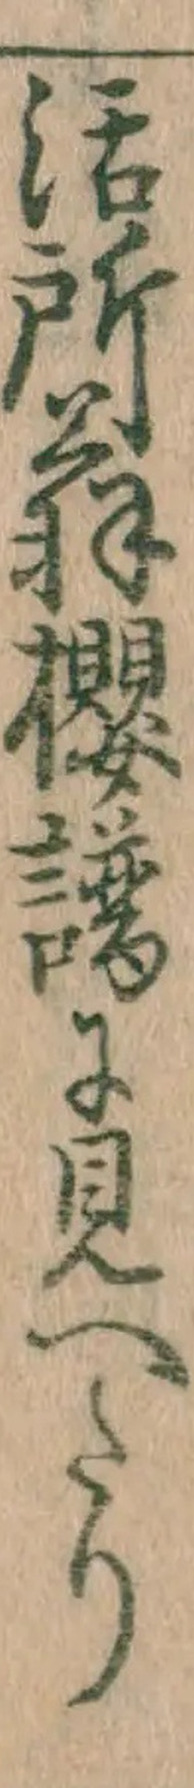活所翁桜譜に見へたり
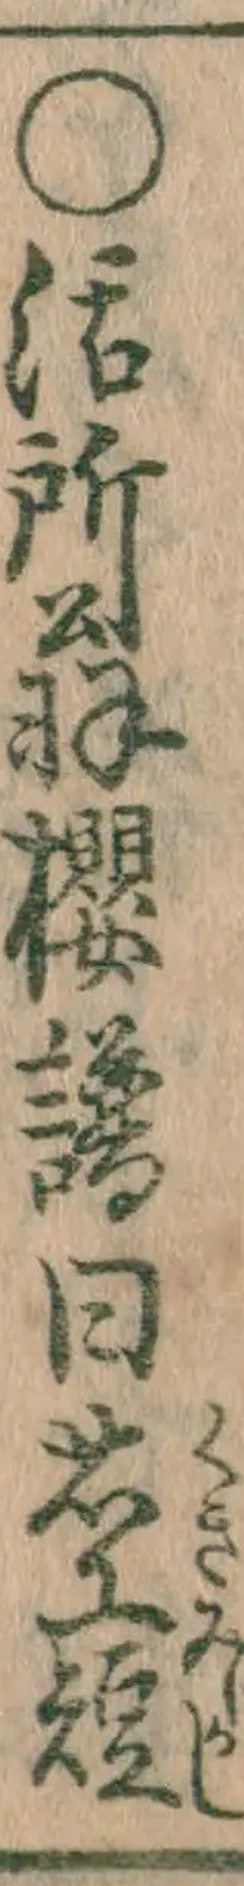○活所翁桜譜曰茎短
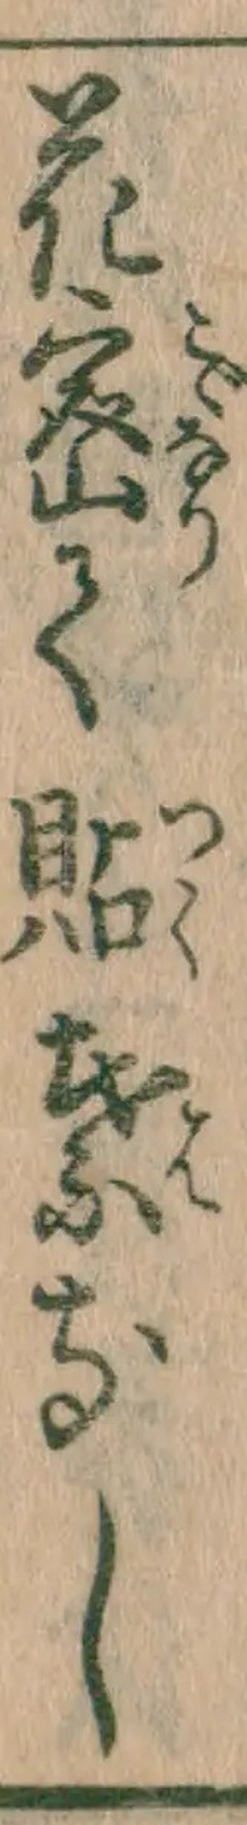花密て貼葉なし
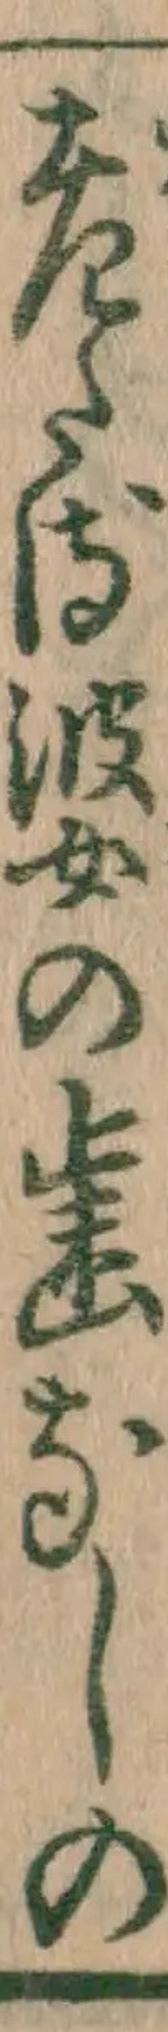老たる婆の歯なしの
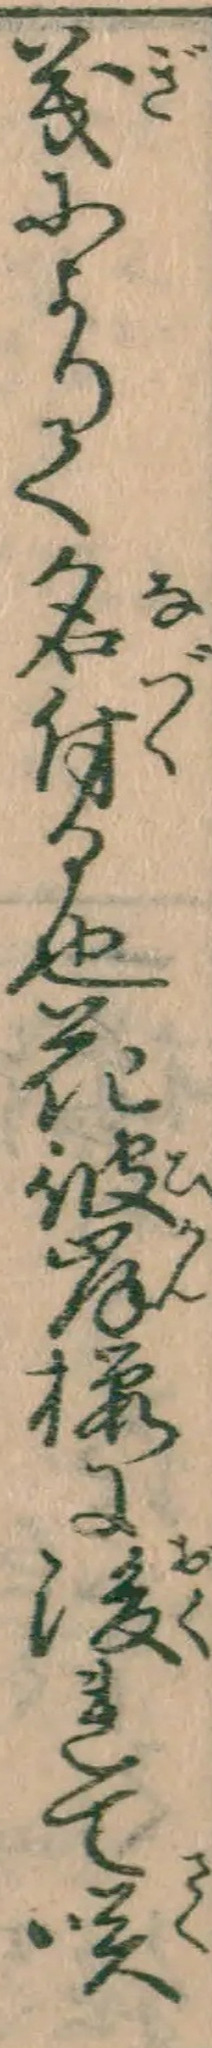義によりて名付る也花彼岸桜に後れて咲
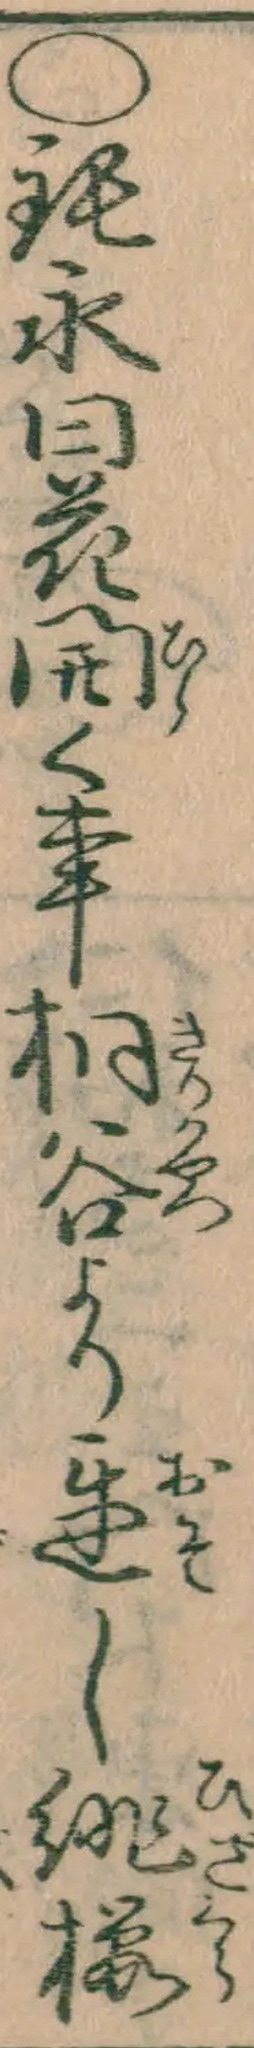○鈍永曰花開く事桐谷より遅し緋桜
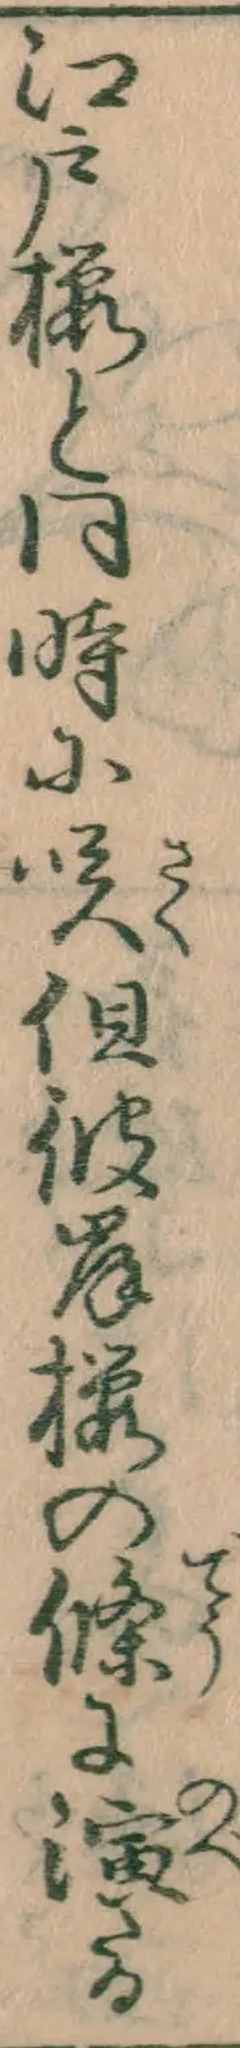江戸桜と同時に咲但彼岸桜の條に演たる
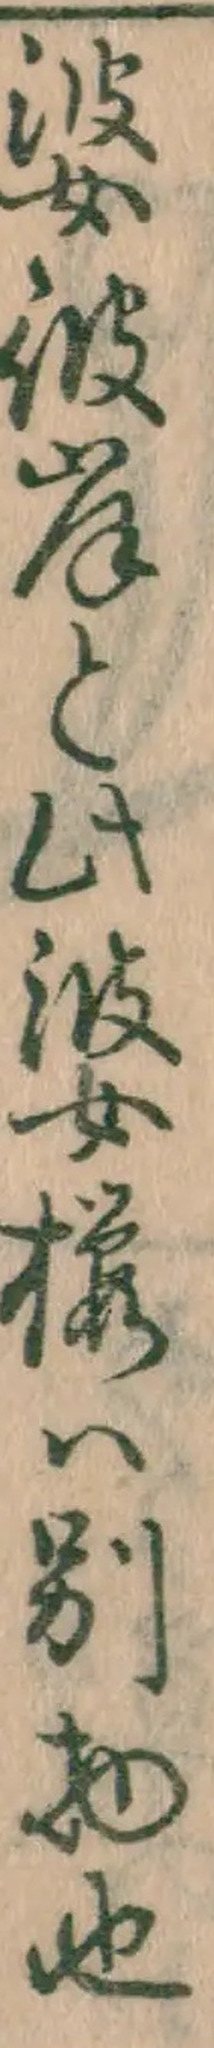婆彼岸と此婆桜は別物也

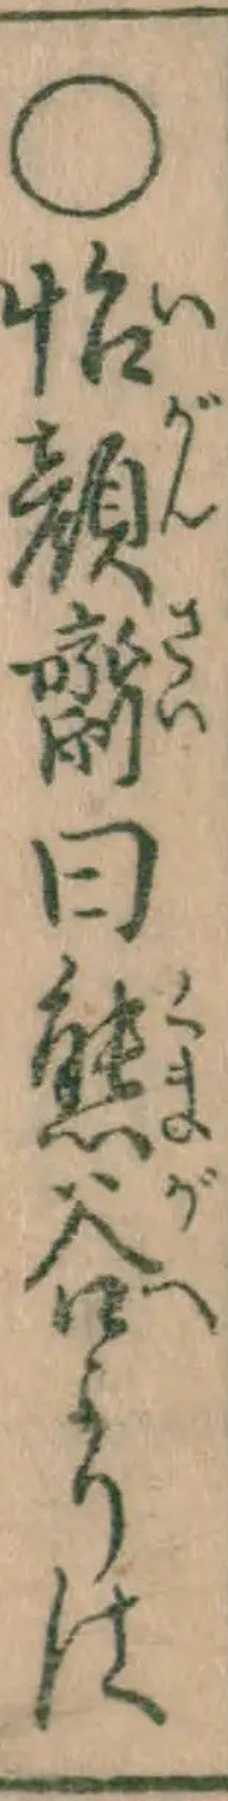○怡顔斎曰熊谷よりは
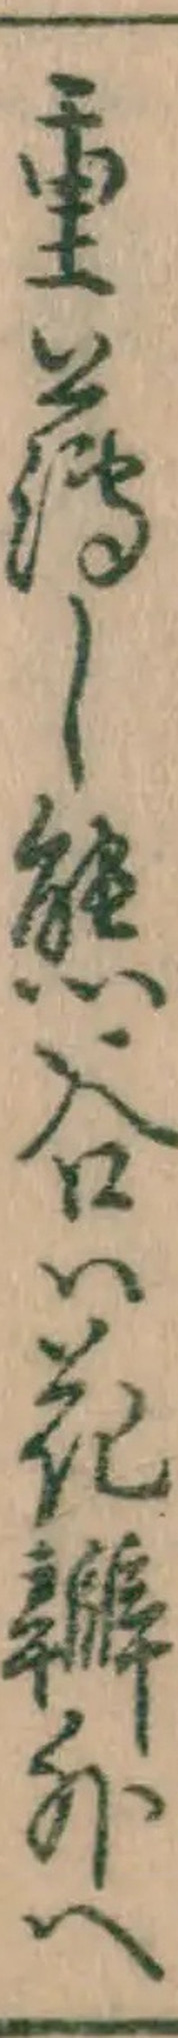重薄し熊谷は花弁外へ
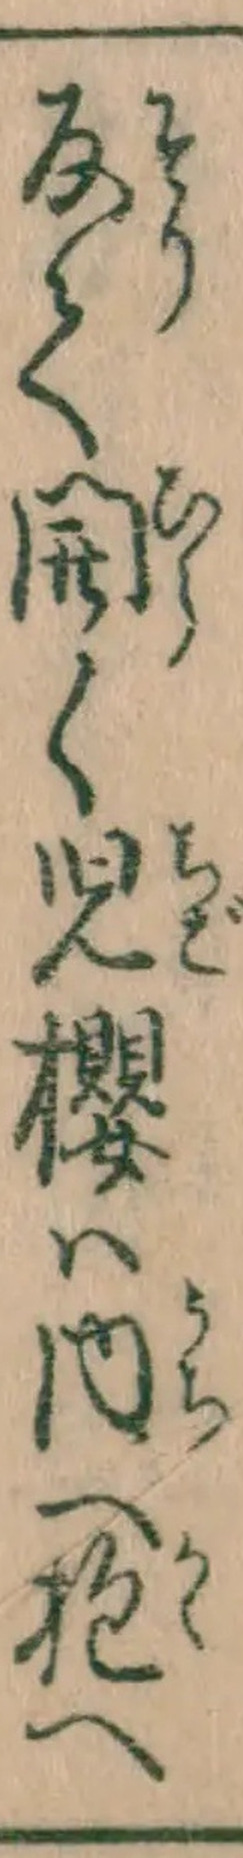反て開く児桜は内へ抱へ
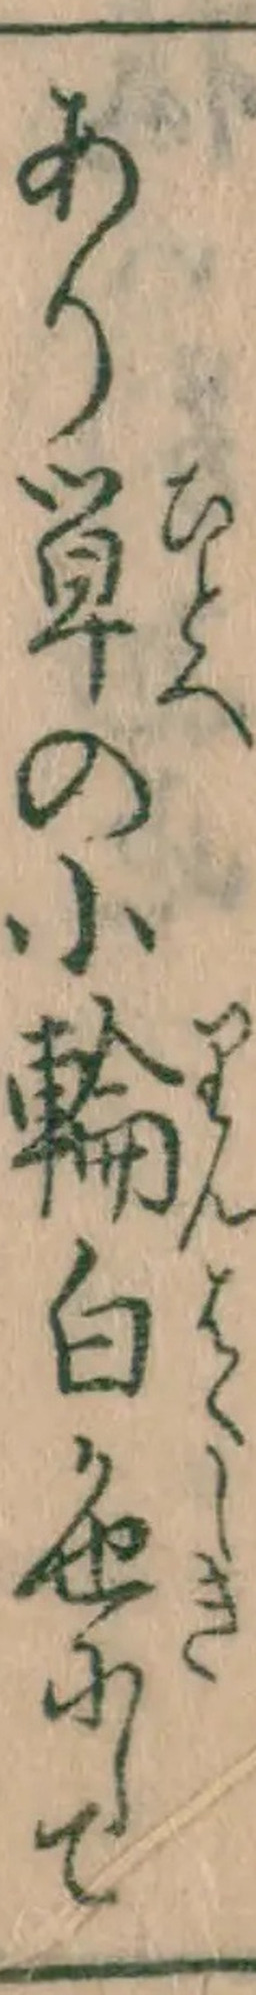あり単の小輪白色にして
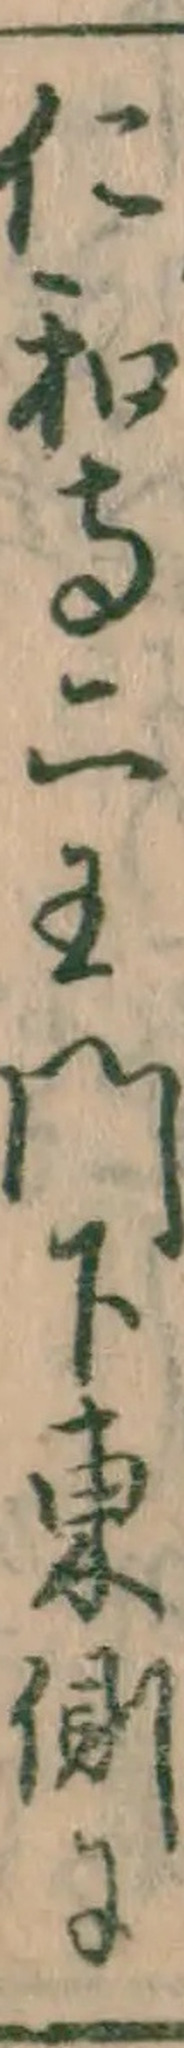仁和寺二王門下東側に
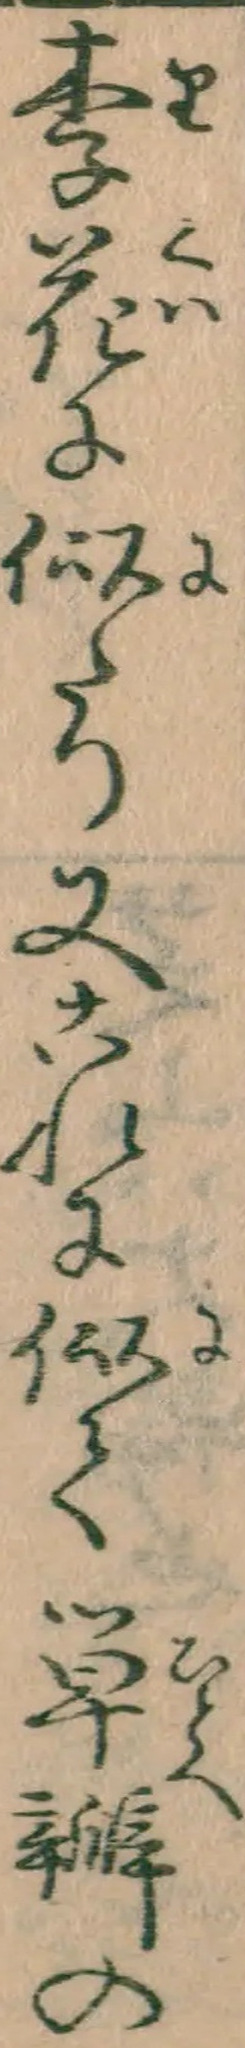李花に似たり又これに似て単弁の
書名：怡顔齋櫻品
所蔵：国立国会図書館 National Diet Library, JAPAN
